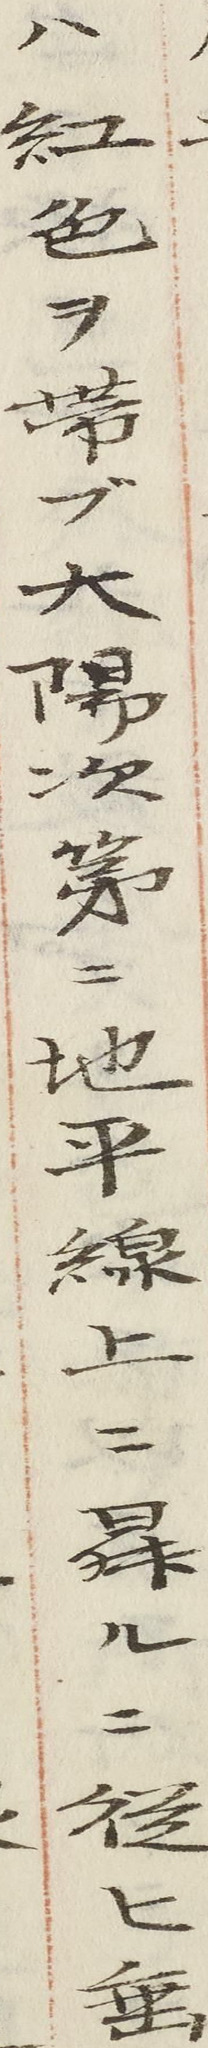ハ紅色ヲ帯ブ大陽次第ニ地平線上ニ昇ルニ従ヒ垂
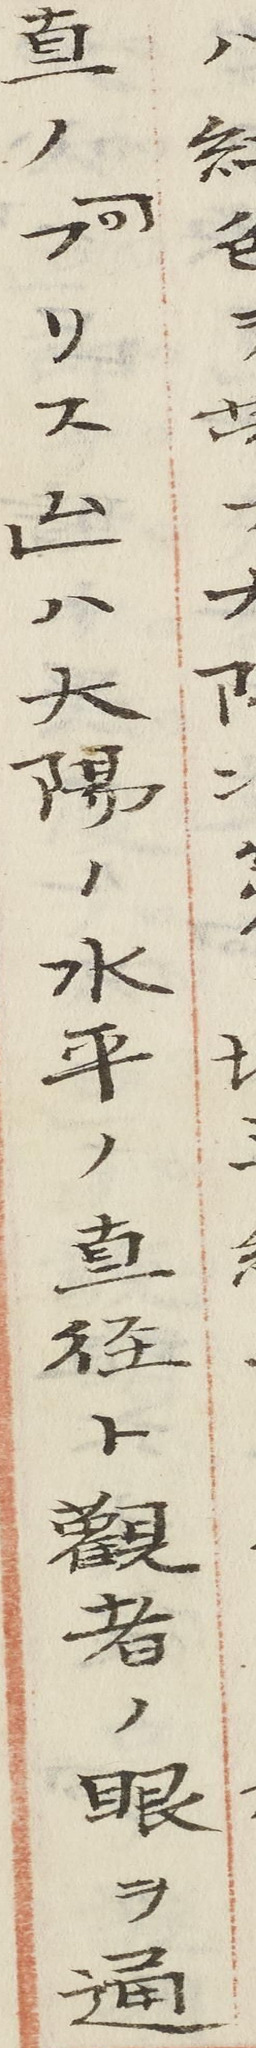直ノ「プリスム」ハ大陽ノ水平ノ直径ト観者ノ眼ヲ通
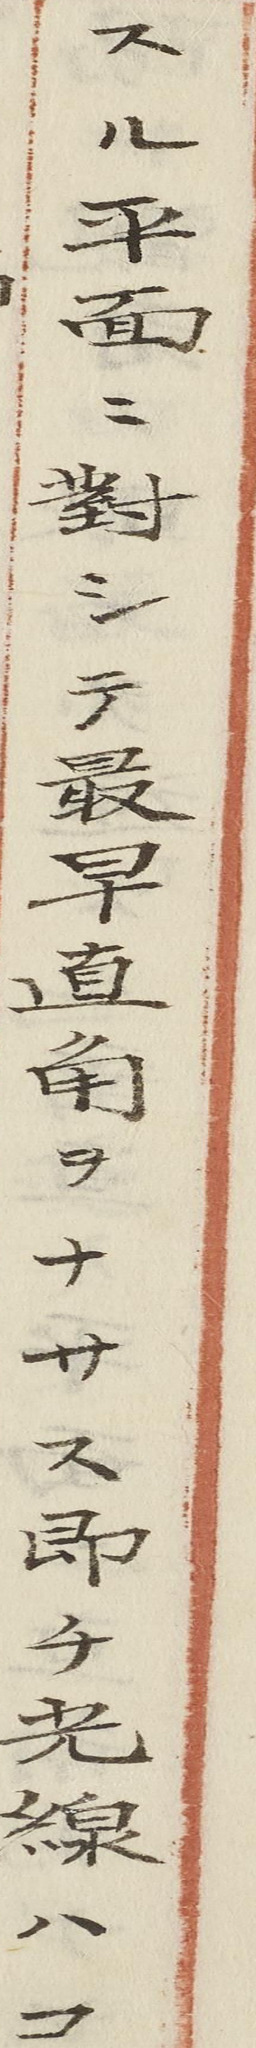スル平面ニ対シテ最早直角ヲナサス即チ光線ハコ
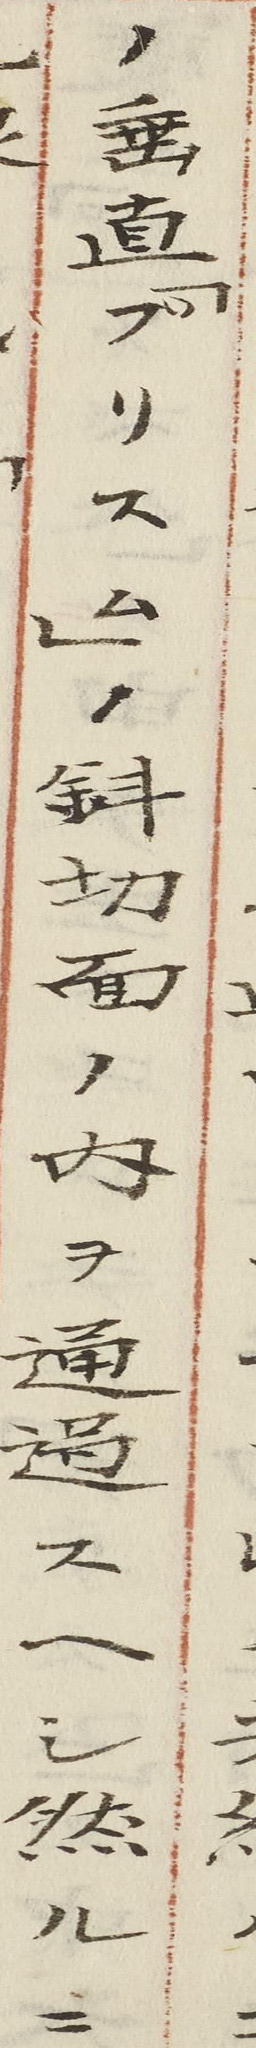ノ垂直「プリスム」ノ斜切面ノ内ヲ通過スヘシ然ルニ
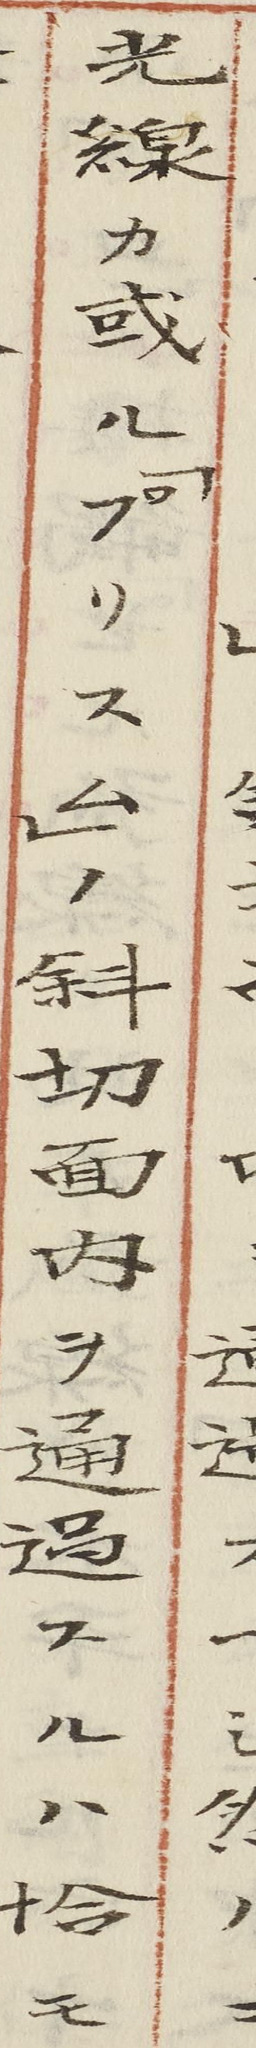光線カ或ル「プリスム」ノ斜切面内ヲ通過スルハ恰モ
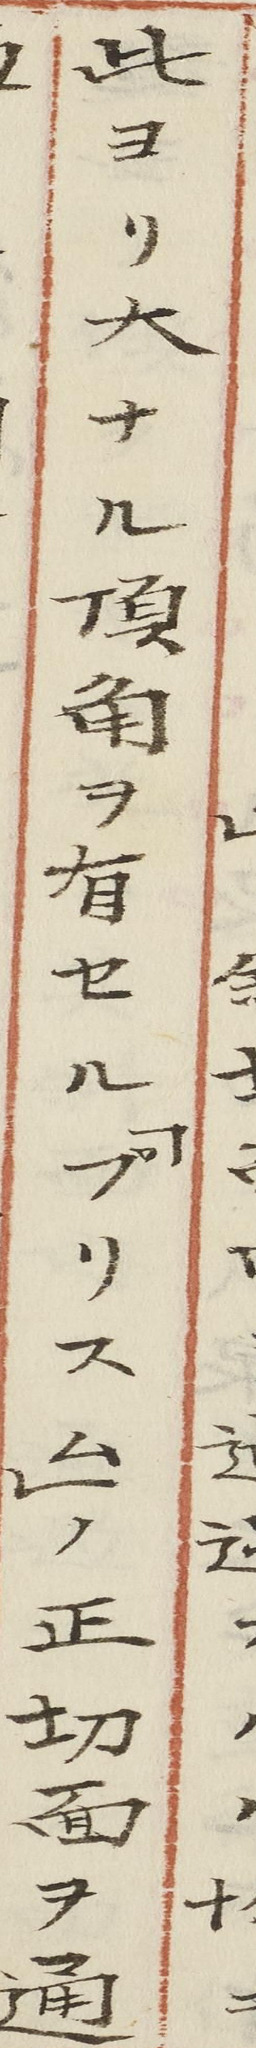此ヨリ大ナル頂角ヲ有セル「プリスム」ノ正切面ヲ通
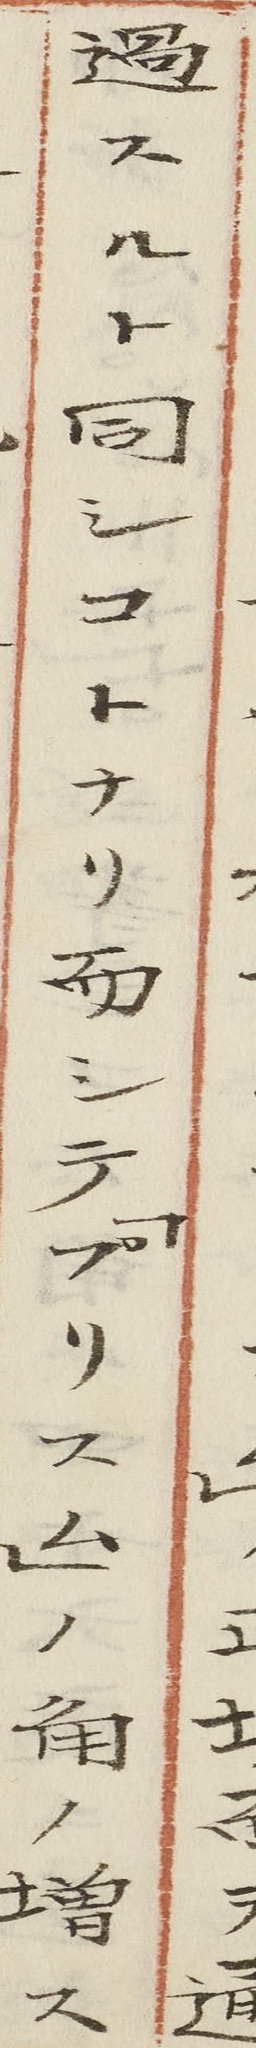過スルト同シコトナリ而シテ「プリスム」ノ角ノ増ス
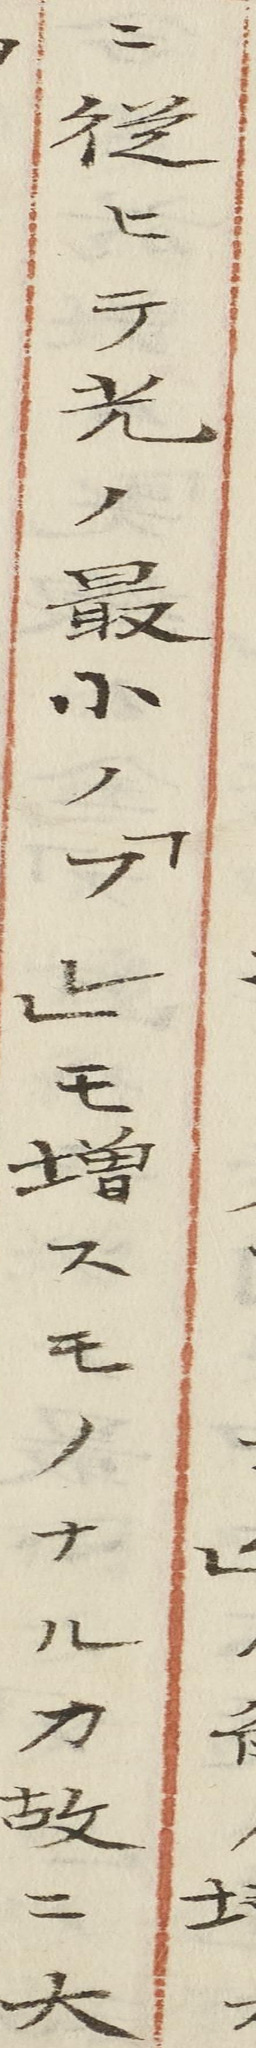ニ従ヒテ光ノ最小ノ「フレ」モ増スモノナルカ故ニ大
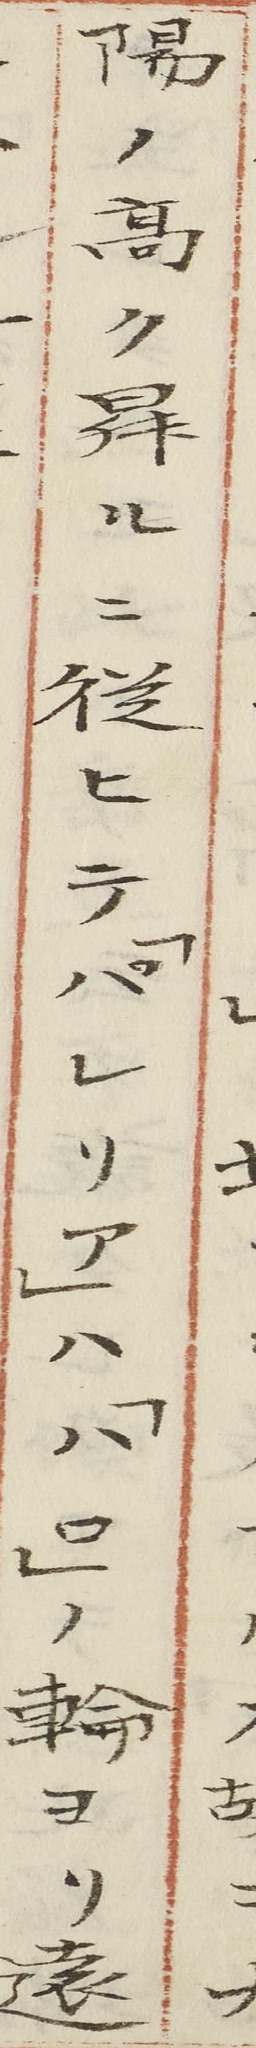陽ノ高ク昇ルニ従ヒテ「パレリア」ハ「ハロ」ノ輪ヨリ遠
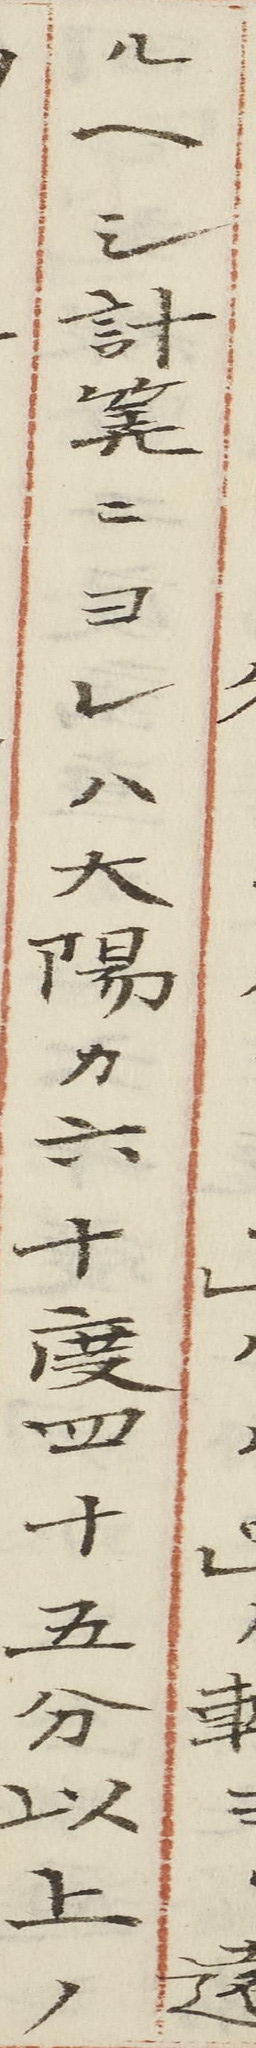ルヘシ計算ニヨレハ大陽カ六十度四十五分以上ノ
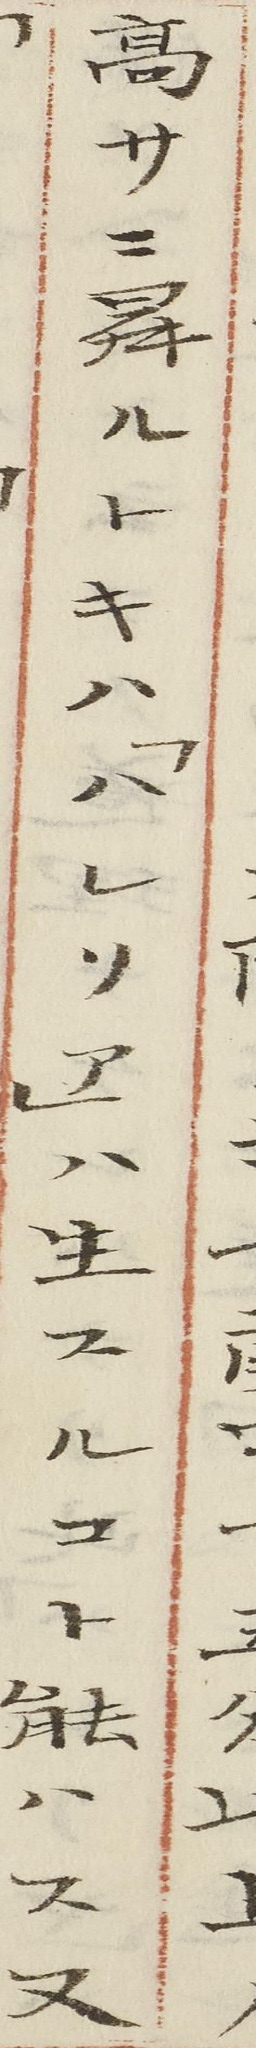高サニ昇ルトキハ「ハレリア」ハ生スルコト能ハス又
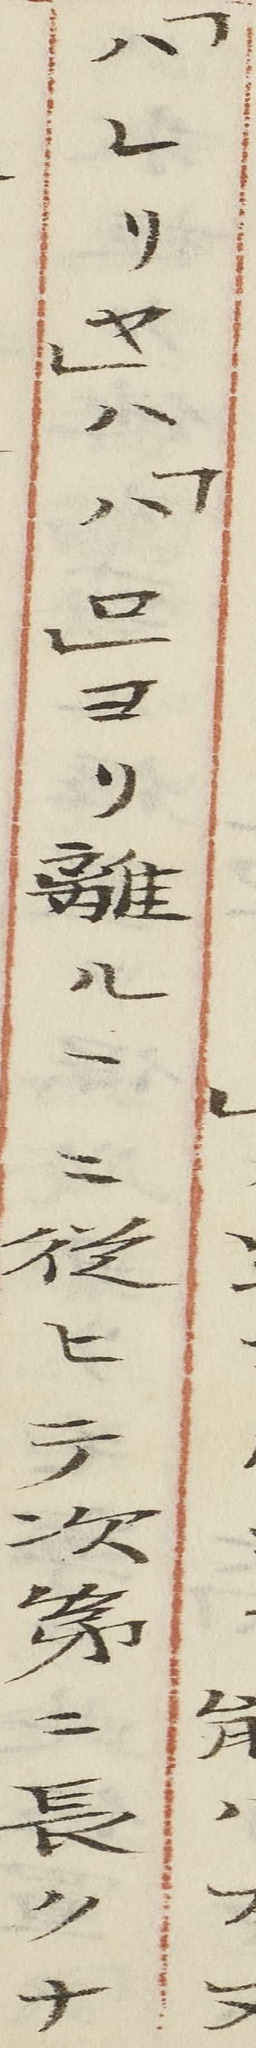「ハレリア」ハ「ハロ」ヨリ離ルヽニ従ヒテ次第ニ長クナ
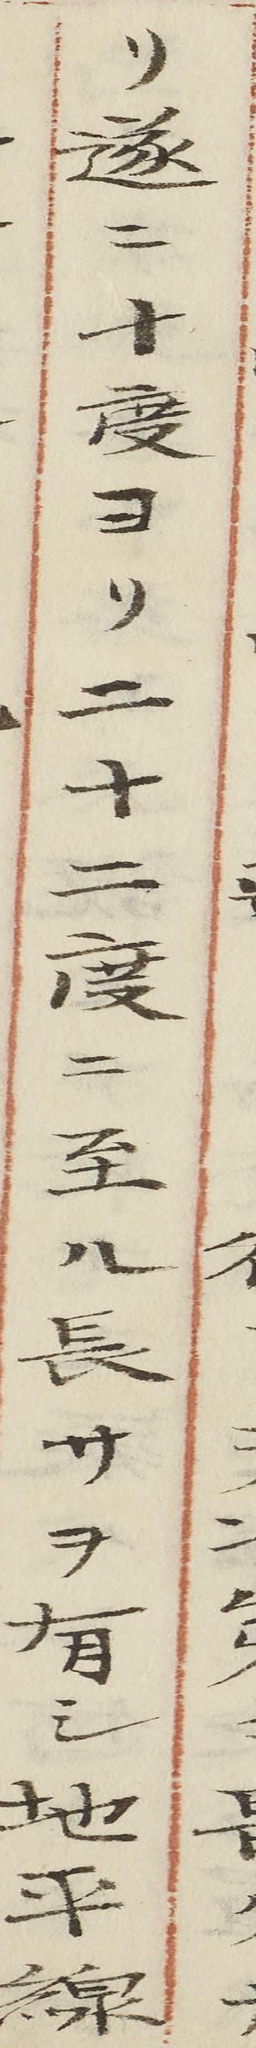リ遂ニ十度ヨリ二十二度ニ至ル長サヲ有シ地平線
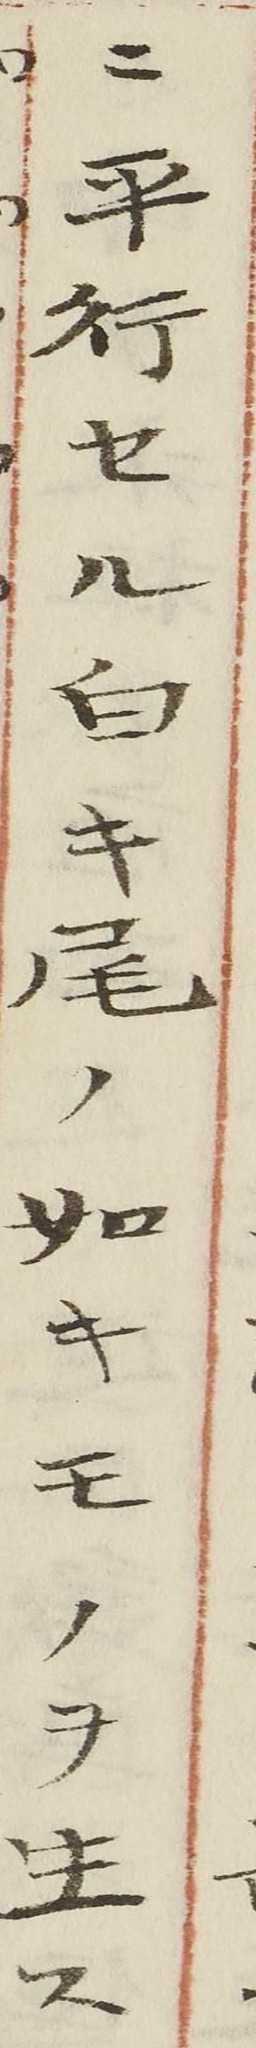ニ平行セル白キ尾ノ如コモノヲ生ス
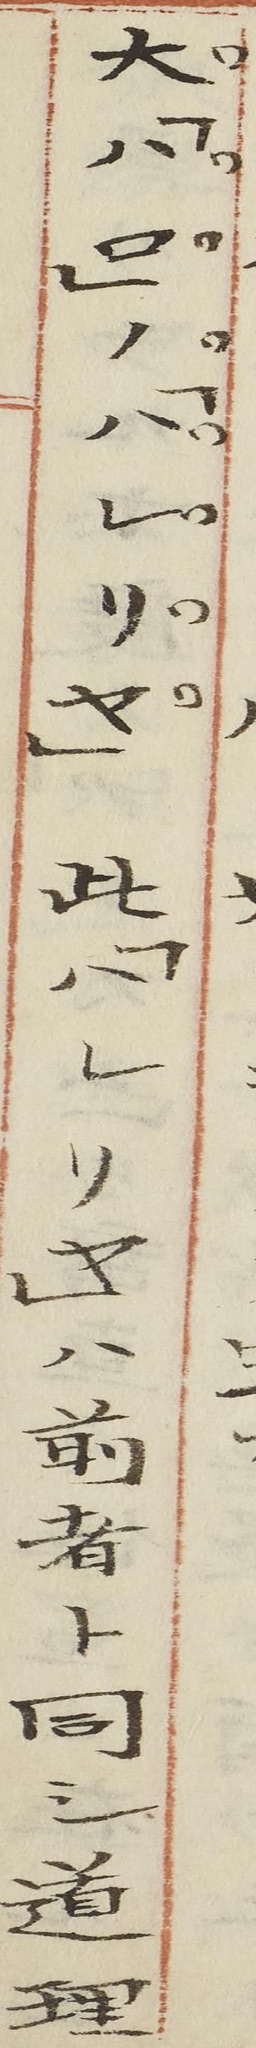大「ハロ」ノ「ハレリヤ」此「ハレリヤ」ハ前者ト同シ道理

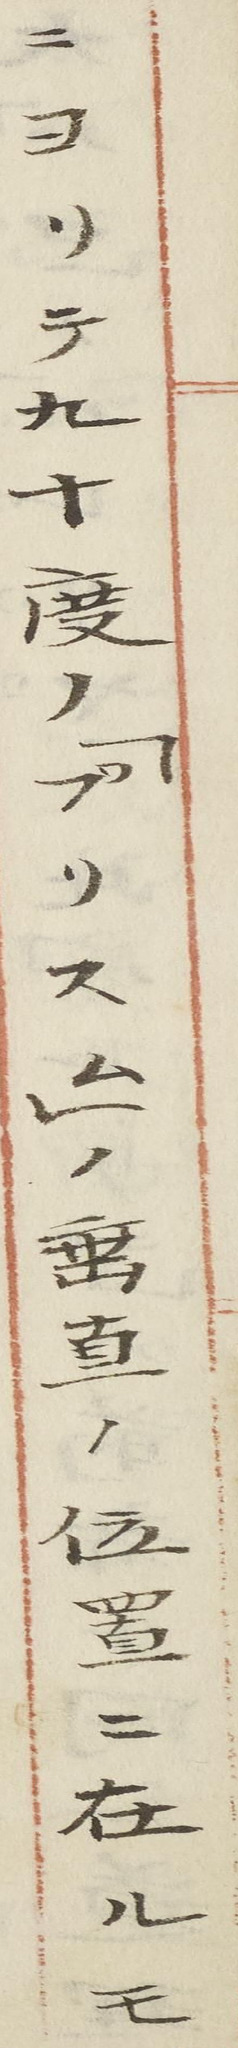ニヨリテ九十度ノ「プリスム」ノ垂直ノ位置ニ在ルモ
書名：虹及ハロノ説明
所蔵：東京大学地震研究所図書室 Earthquake Research Institute Library, The University of Tokyo, JAPAN
